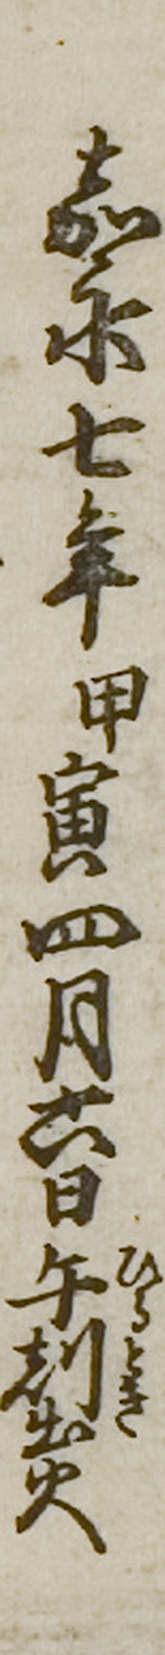嘉永七年甲寅四月六日午刻出火
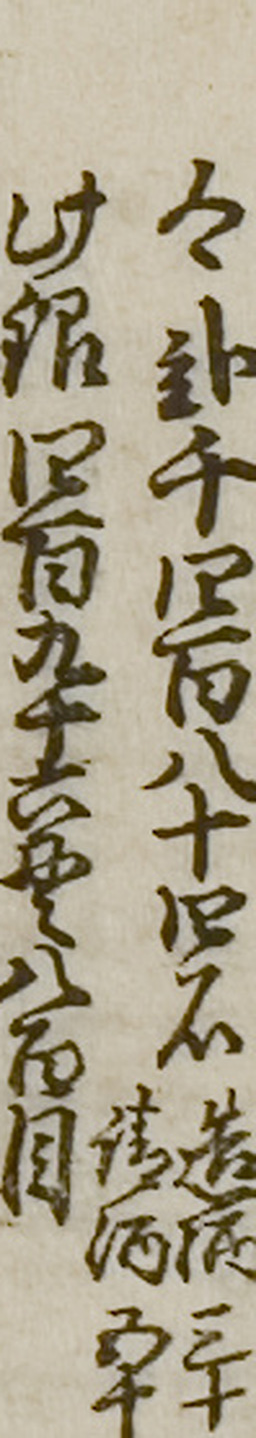此銀四百九十六貫八百目
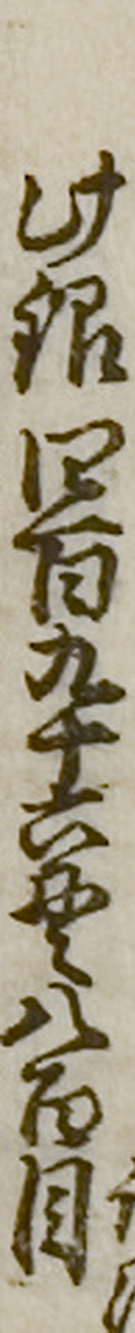此銀四百九十六貫八百目
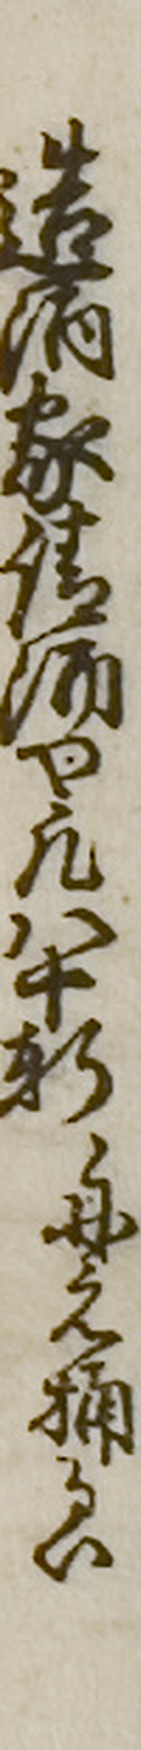たらい造酒家清酒や凡八十軒舟之桶るい
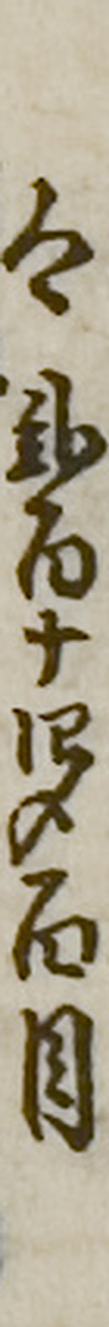おけ合弐百十四貫百目
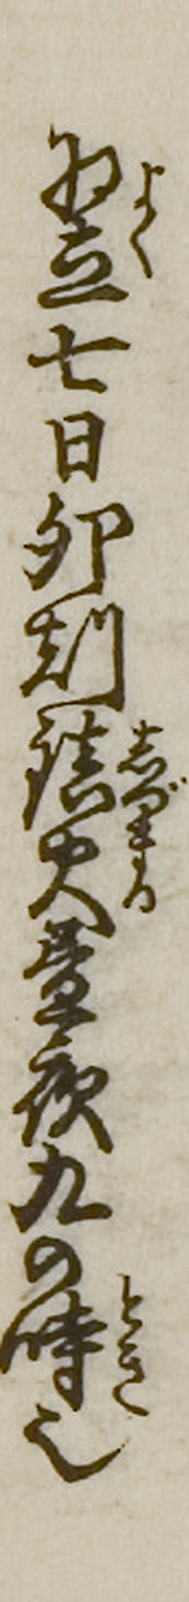翌七日卯刻鎮火昼夜九の時也
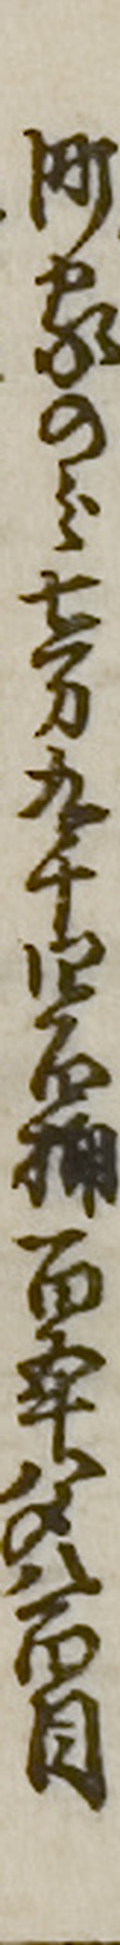町家の分七万九千四百桶百五十八貫八百目
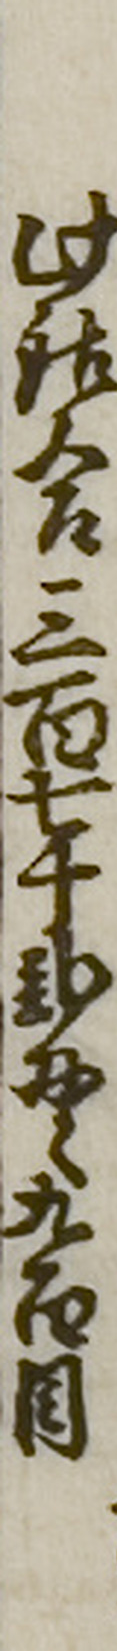此銀合三百七十弐貫九百目
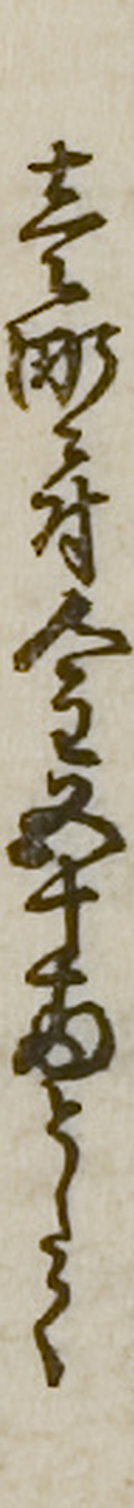壱町に付金五十両として
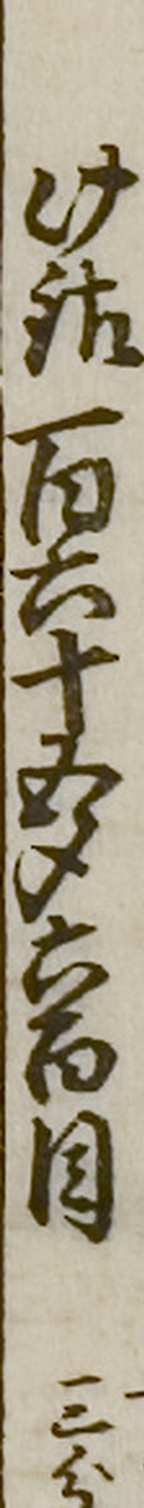此銀百六十五貫六百目
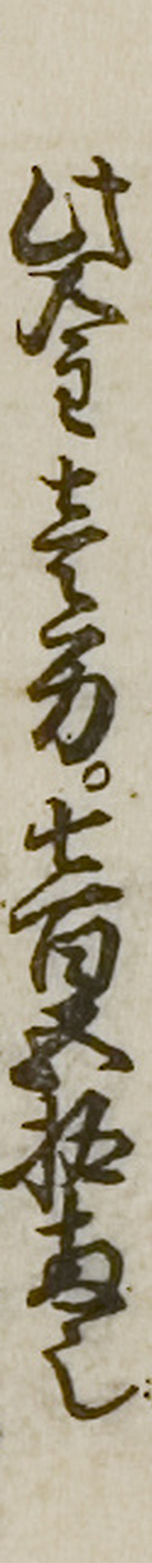此金壱万○七百五拾両也
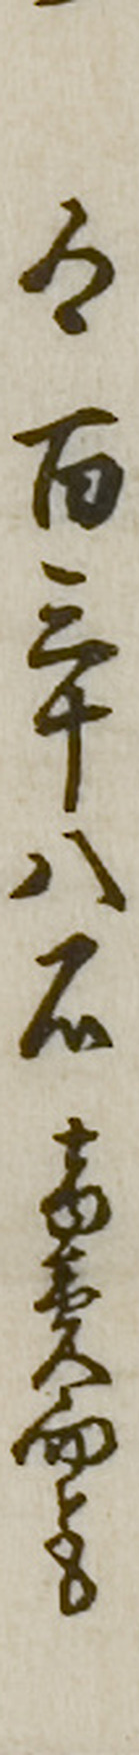合百三十八石商売向とも
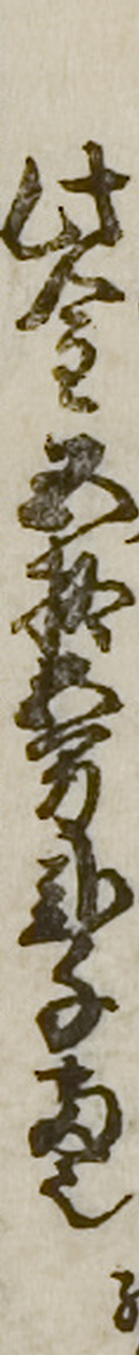此金五拾五万二千両也
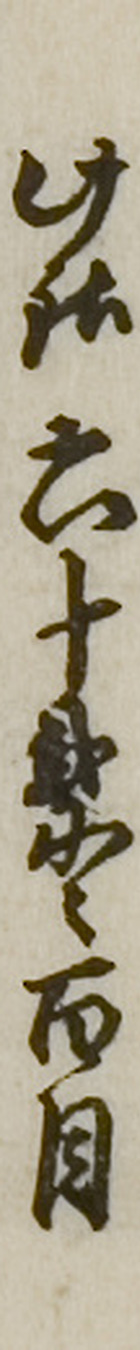此銀六十弐貫百目
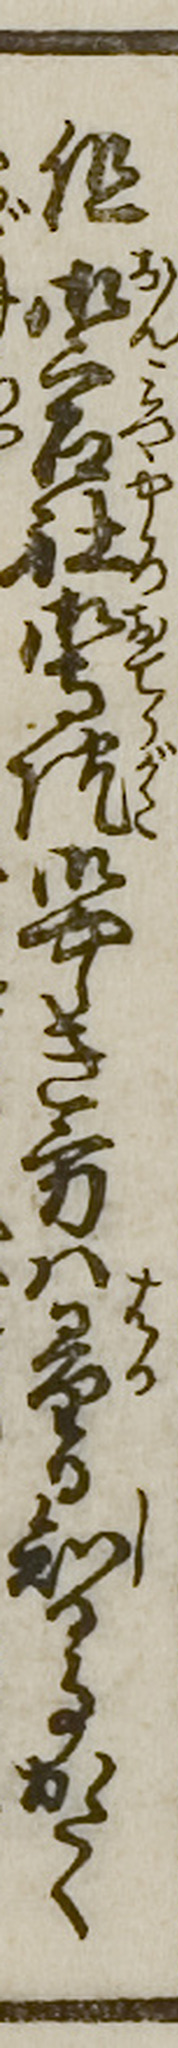但御宮社御寺院御やしき方は量り知る事かたく
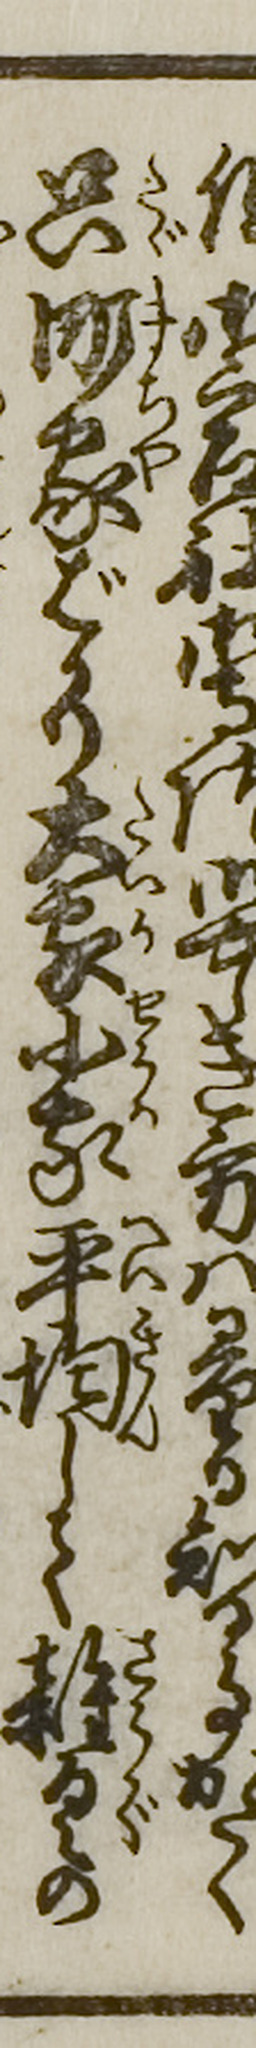只町家ばかり大家小家平均して雑具の
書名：上京火災町家雑具損亡考記
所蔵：東京大学総合図書館 General Library in the University of Tokyo, JAPAN
